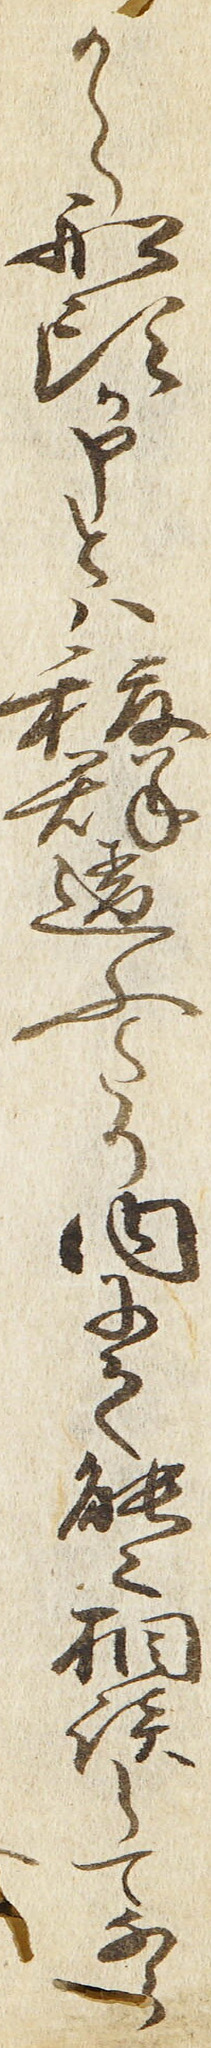から船頭か申とは抜群違ふたり内にて能々相談してなら
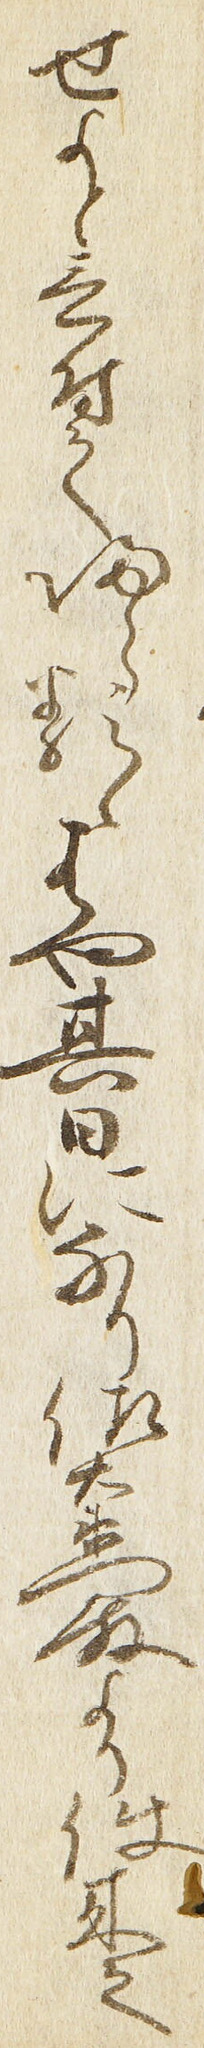せよと言付て帰らるはや其日になり佐右衛門殿より使来て
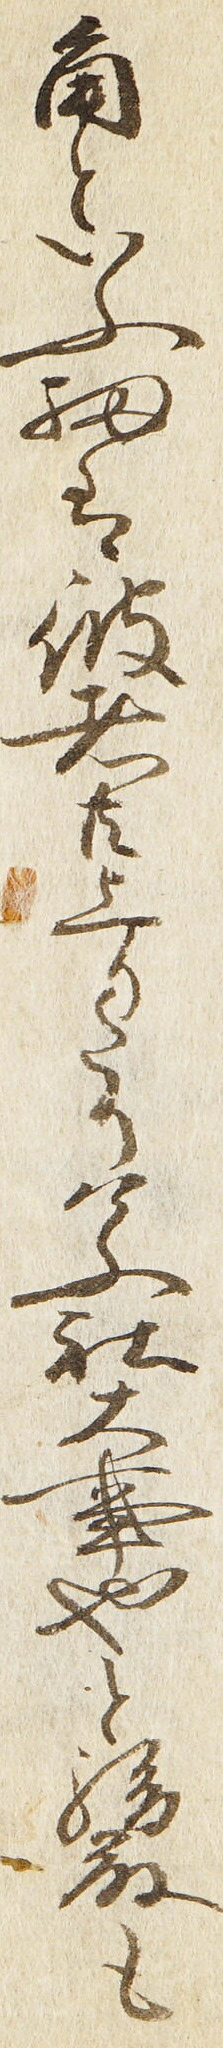角といふ扨は彼者共上りたりけふ社大事也と後藤も
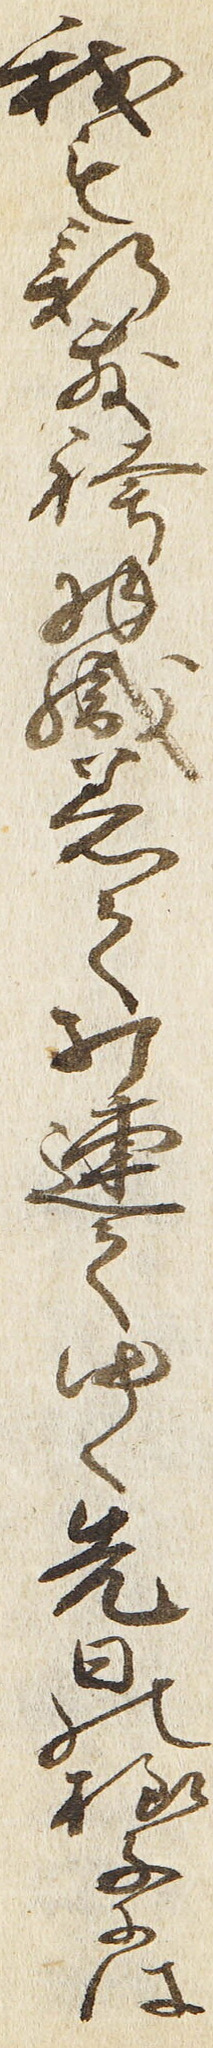我も新敷袴羽織着て打連てゆく先日の様子には
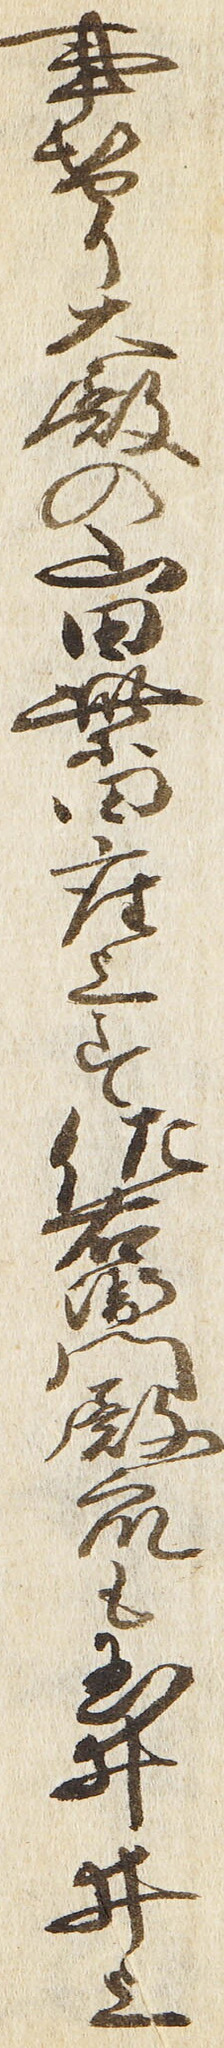事替り大殿の山田柴田座上す佐右衛門殿衆も玉井井上
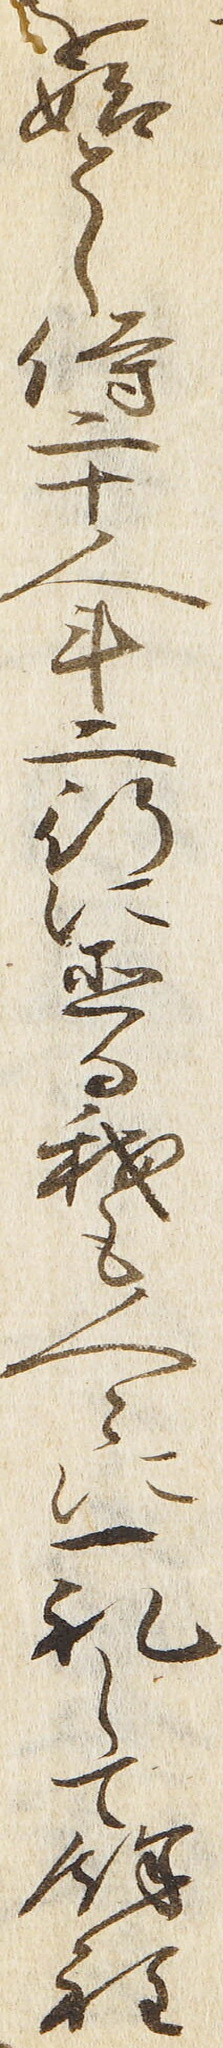を始とし侍二十人斗ニ行に直る我も人々に一礼して余程
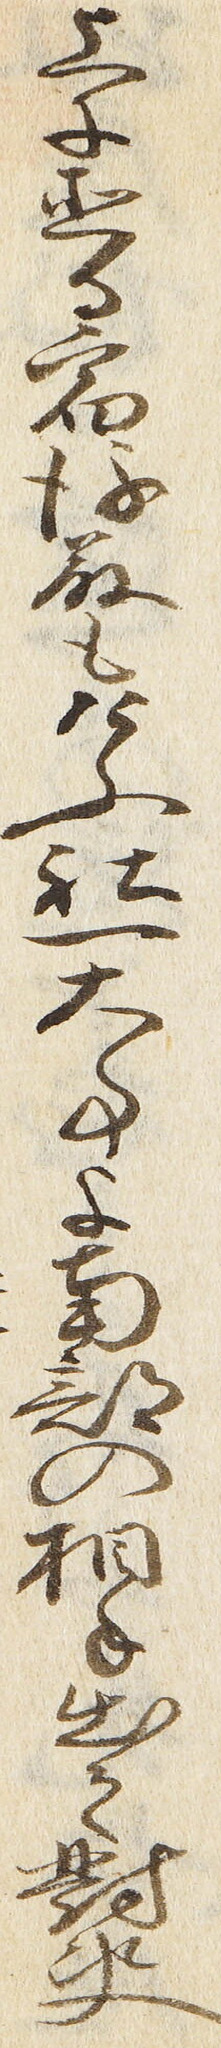上に直る宿後藤もけふ社一大事に南部の相手出て対決
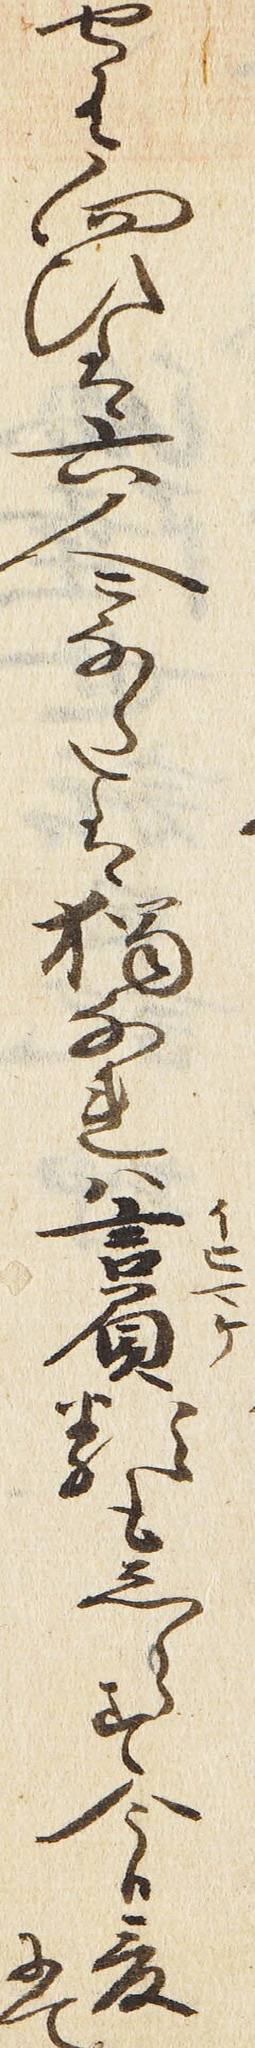せは向ひは六人こなたは独なれは言負るもしらす卿今日爰にて
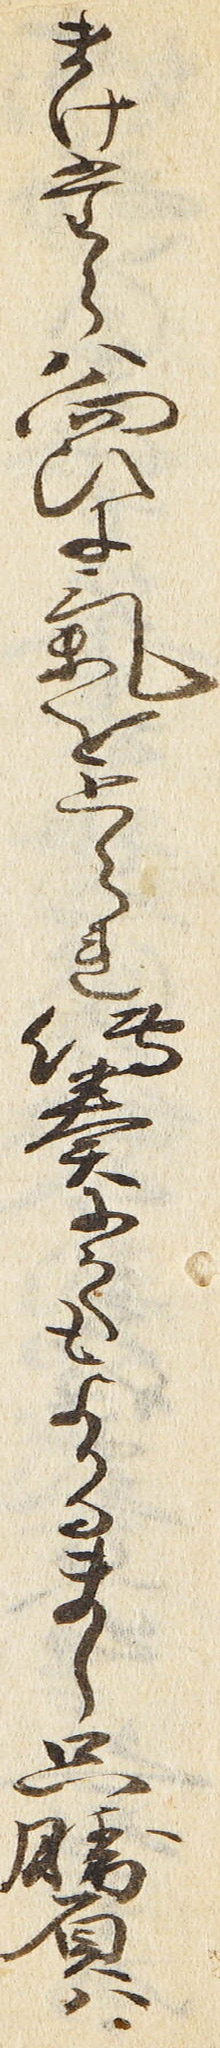まけたらは向ひに気をとられ伝奏にてもよかるまし只勝負は
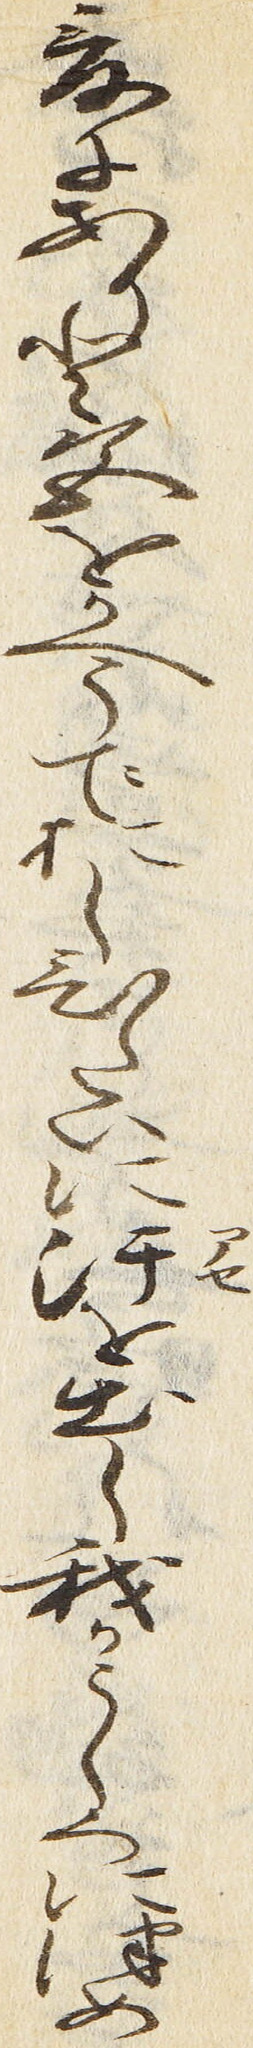爰にありと色をかへうでおしひたいに汗を出し我かうしろにつめ
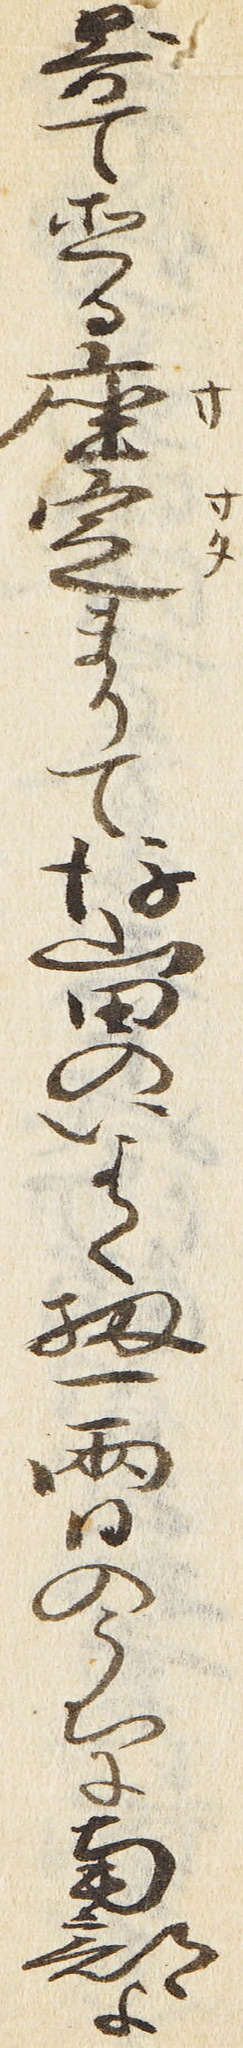寄て直る座定まりて後山田のいはく扨一両日のうちに南部よ
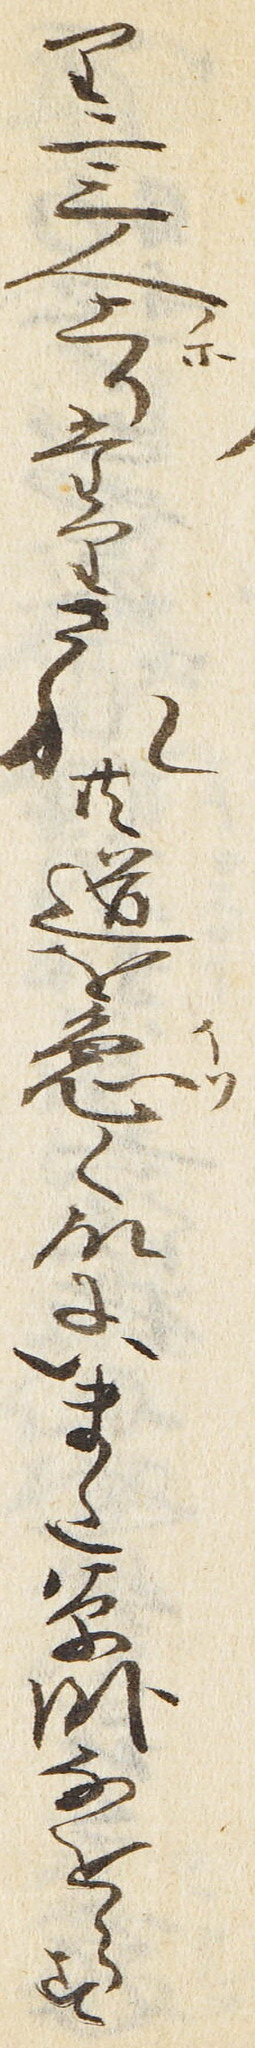り二三人上りたりされ共道を急く故にいまた草臥なをらす
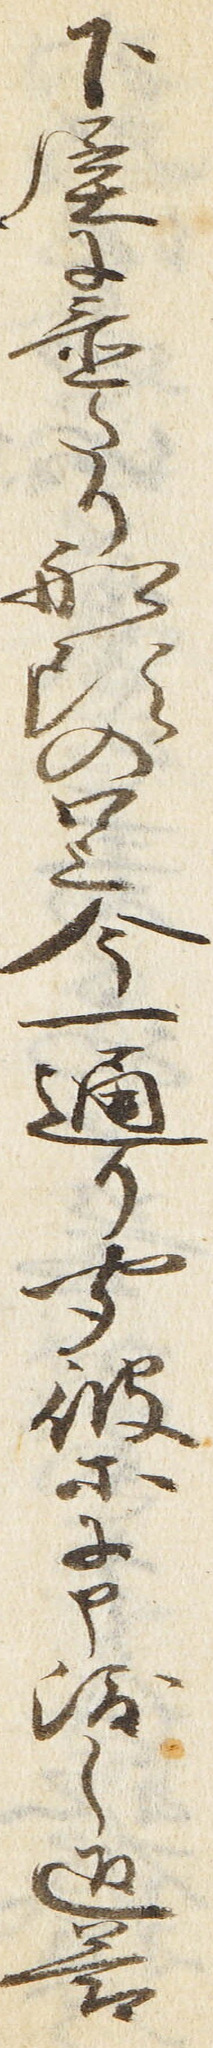下屋に置たり船頭の口上今一通り聞彼等に申渡し返答
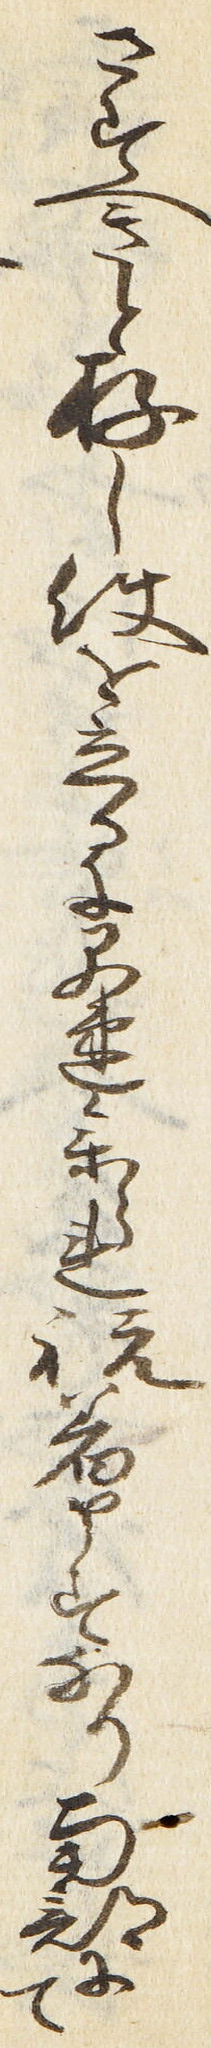さすへきと存し使を立るに早速参られ祝着申すなり南部にて
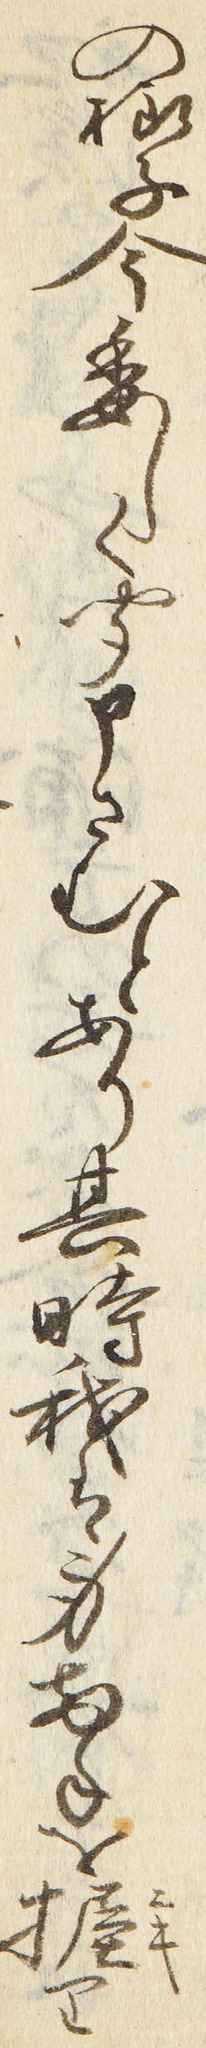の様子今委しく聞申さむとあり其時我は身両手を握り
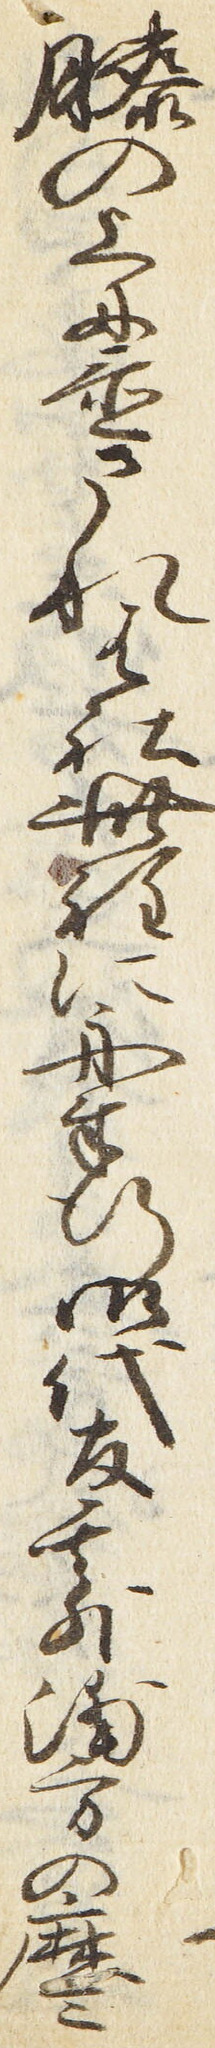膝の上に置されは社此程に舟奉行御代官其外浦方の歴々
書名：海陸世話日記
